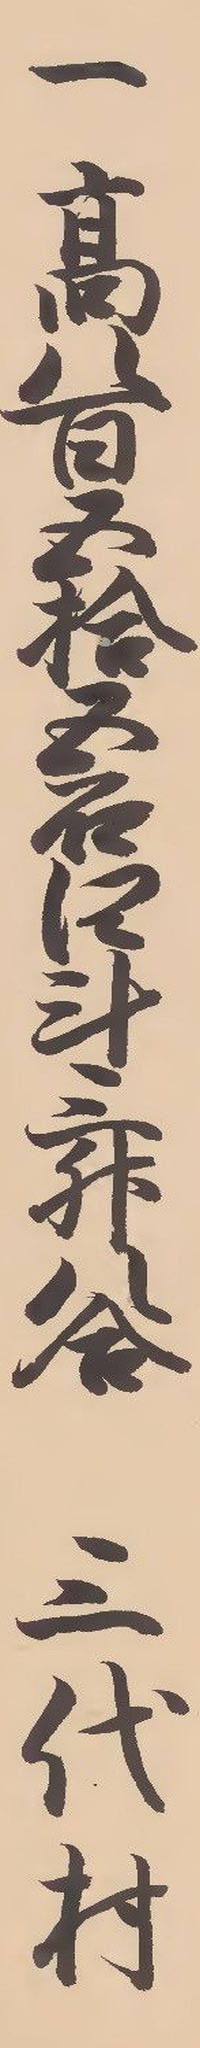一高八百五拾五石四斗三升八合三代村
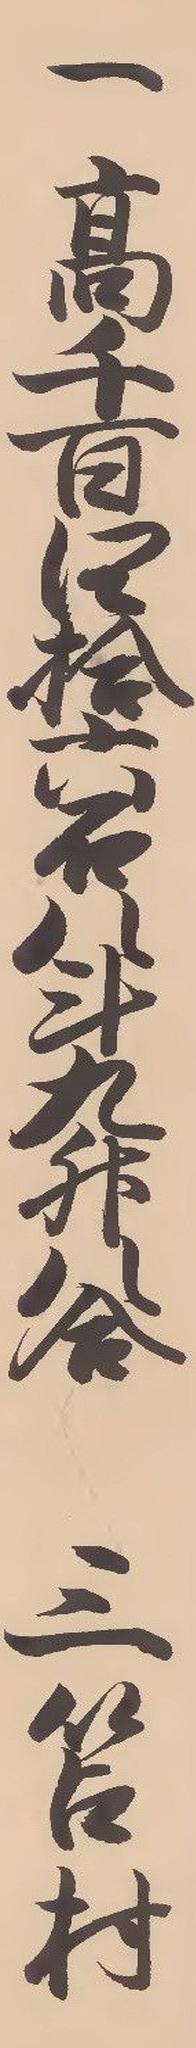一高千百四拾六石八斗九升八合三笘村
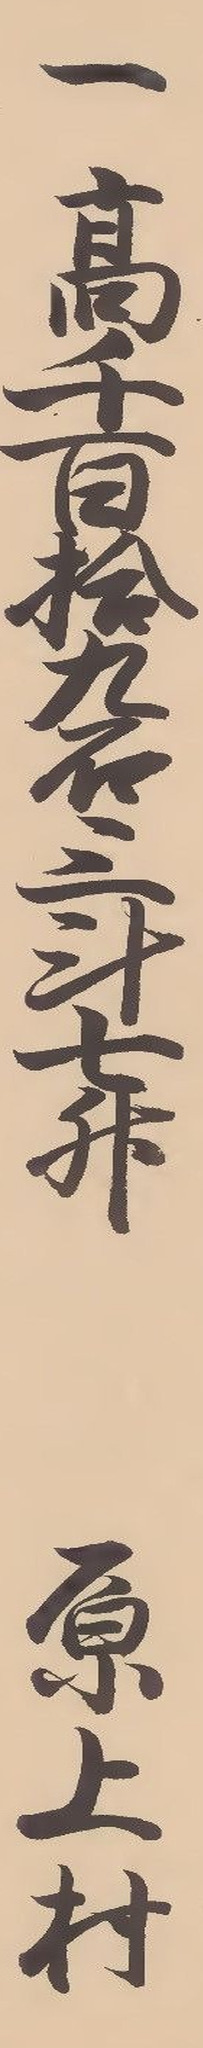一高千百拾九石三斗七升原上村
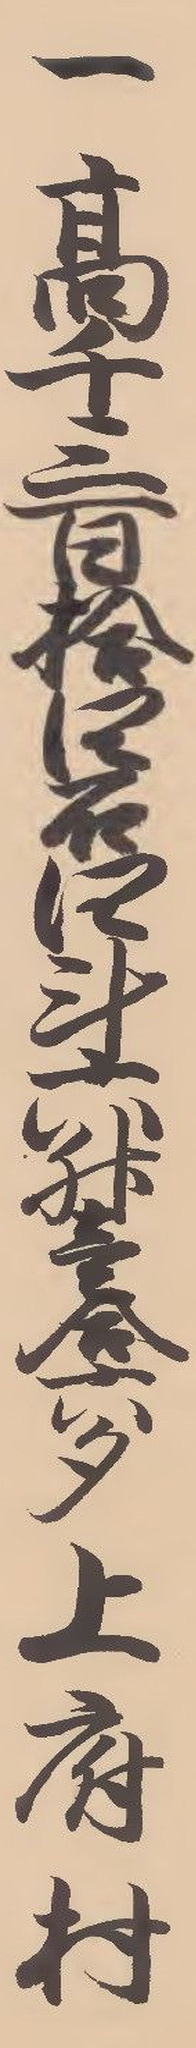一高千三百拾四石四斗六升壱合六勺上府村
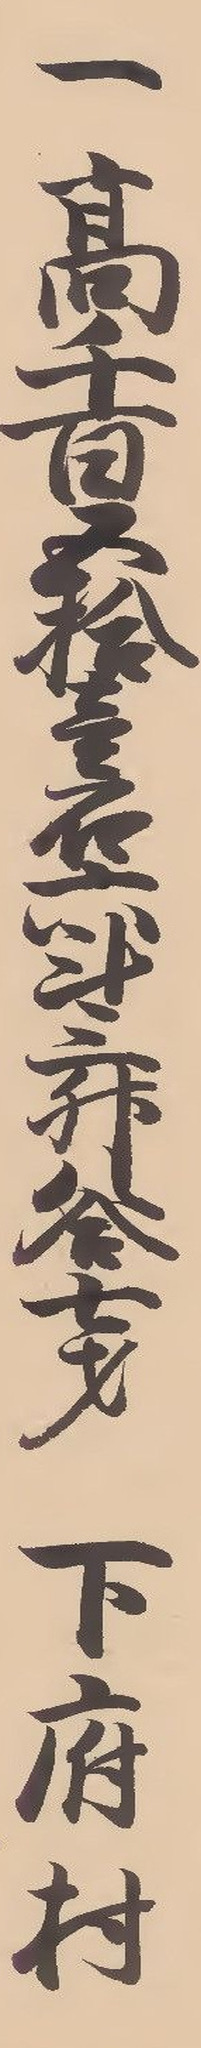一高千百五拾壱石六斗三升八合七才下府村

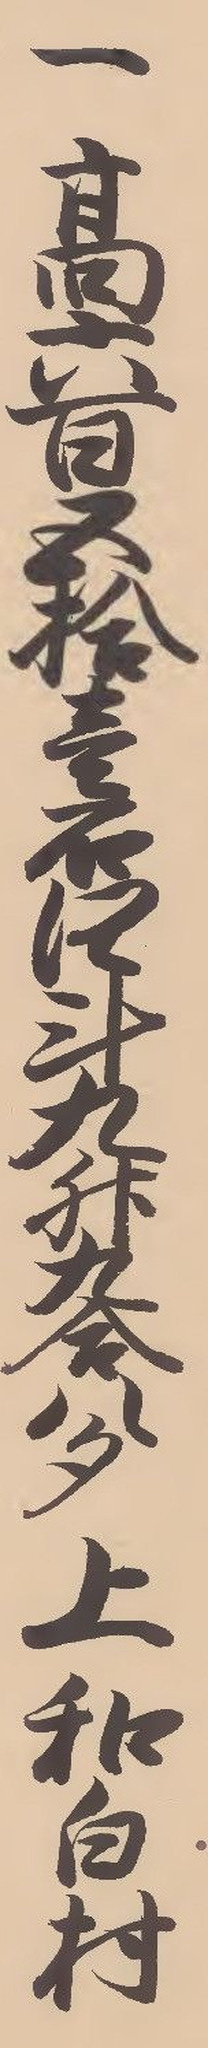一高六百五拾壱石四斗九升九合八勺上和白村
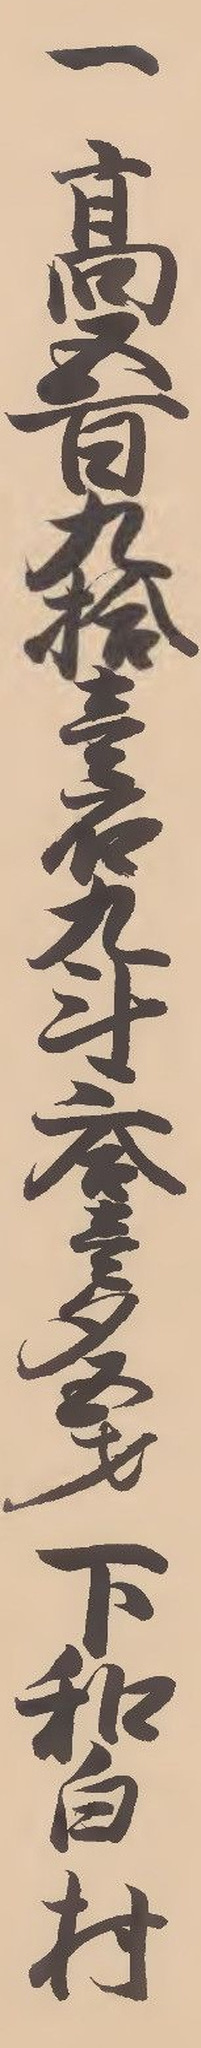一高五百九拾壱石九斗三合壱勺五才下和白村
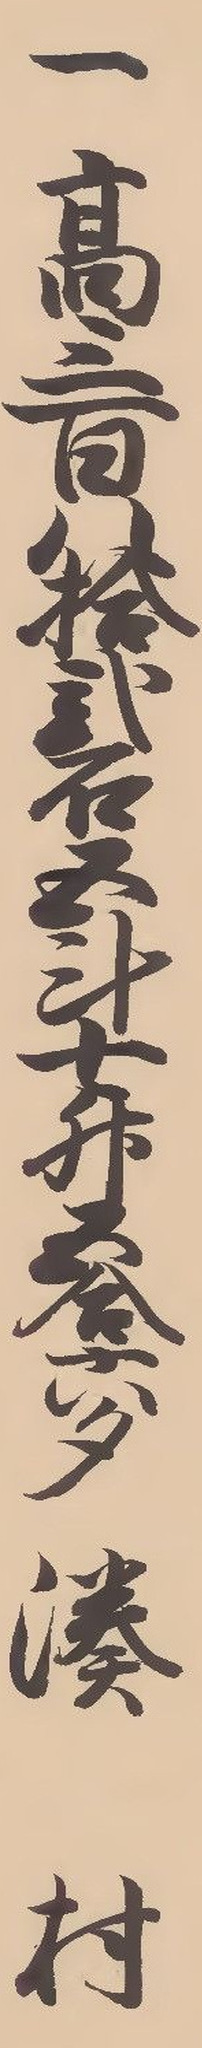一高三百八拾弐石五斗七升五合六勺湊村
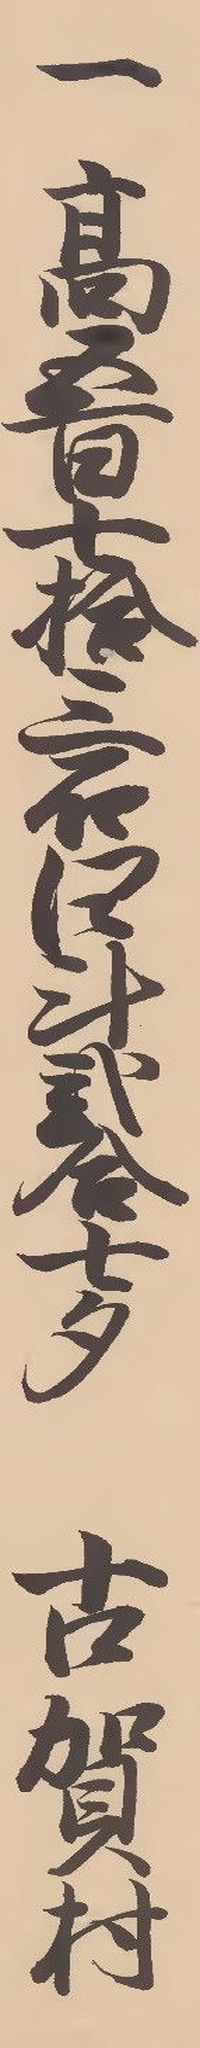一高五百七拾三石四斗弐合七勺古賀村
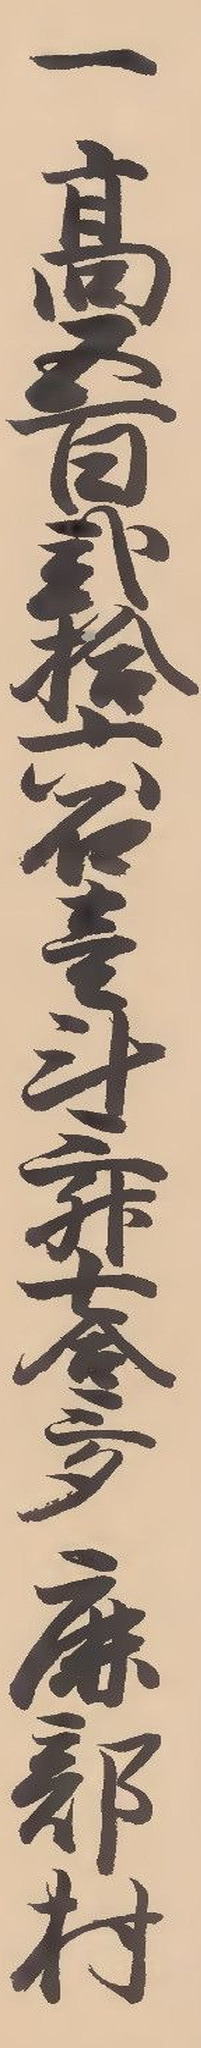一高五百弐拾六石壱斗三升七合三勺鹿部村
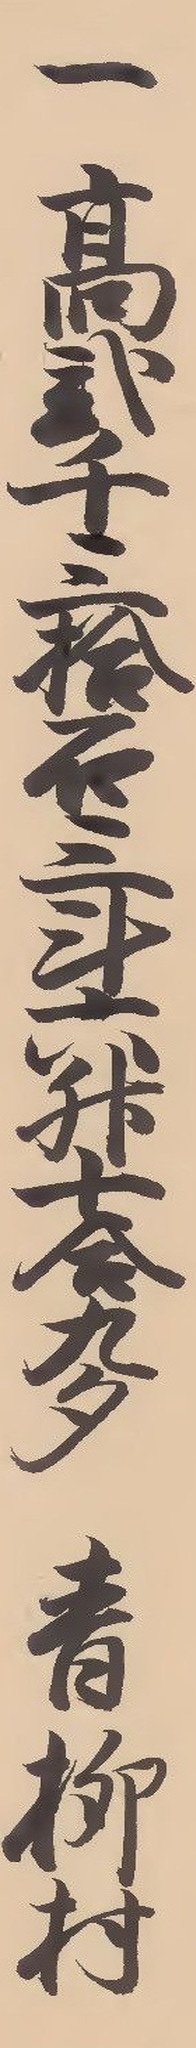一高弐千三拾石三斗六升七合九勺青柳村
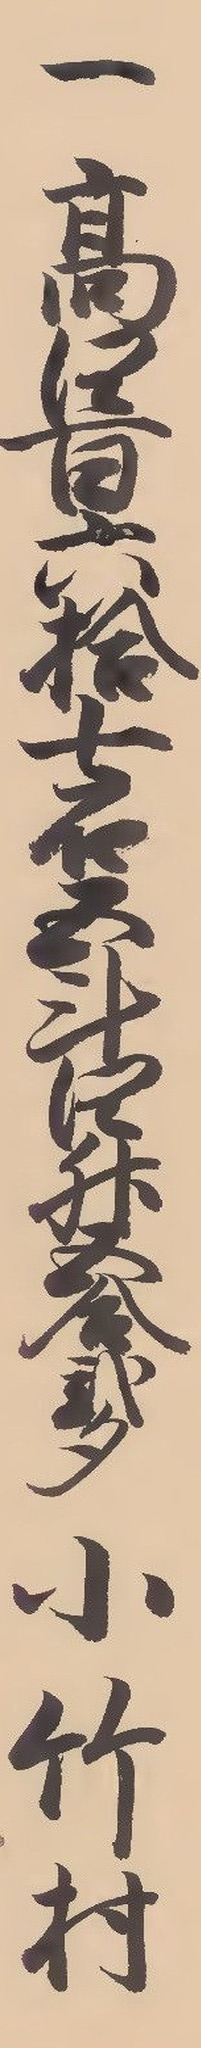一高四百六拾七石五斗四升五合弐勺小竹村

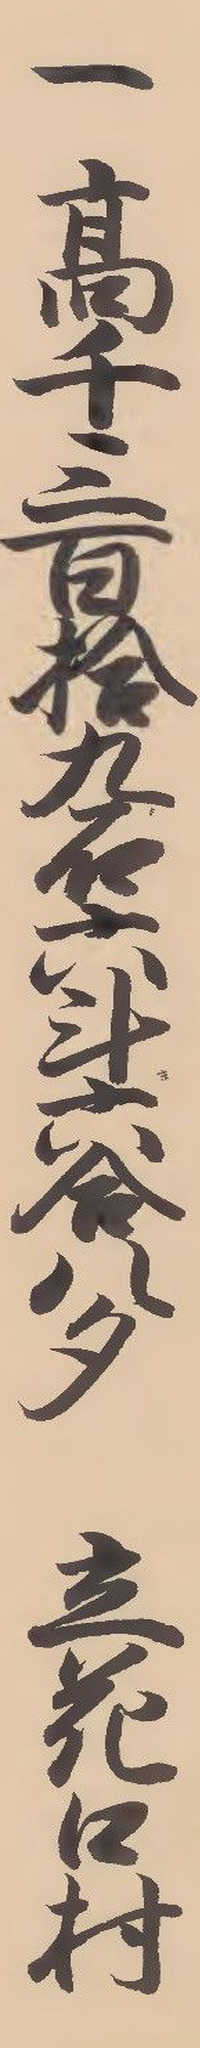一高千三百拾九石六斗六合八勺立花口村
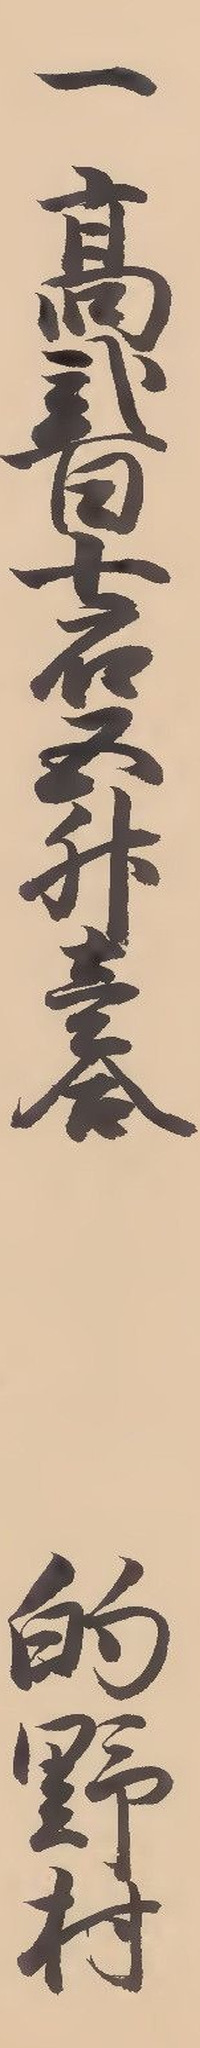一高弐百七石五升壱合的野村
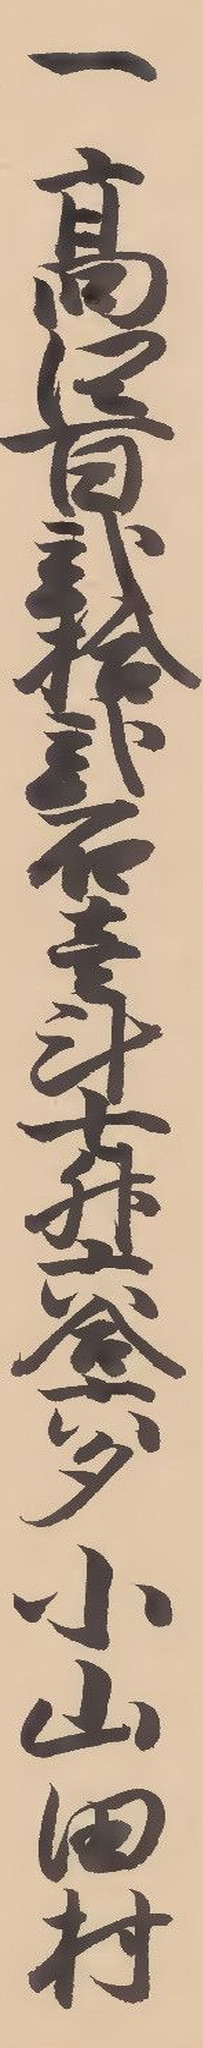一高四百弐拾弐石壱斗七升六合六勺小山田村
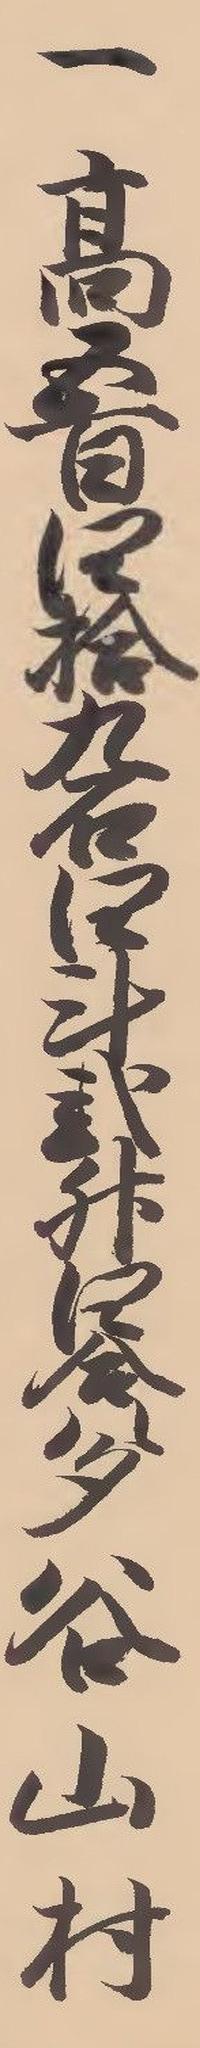一高五百四拾九石四斗弐升四合八勺谷山村
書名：筑前国郷帳
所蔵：国立公文書館 National Archives of Japan
